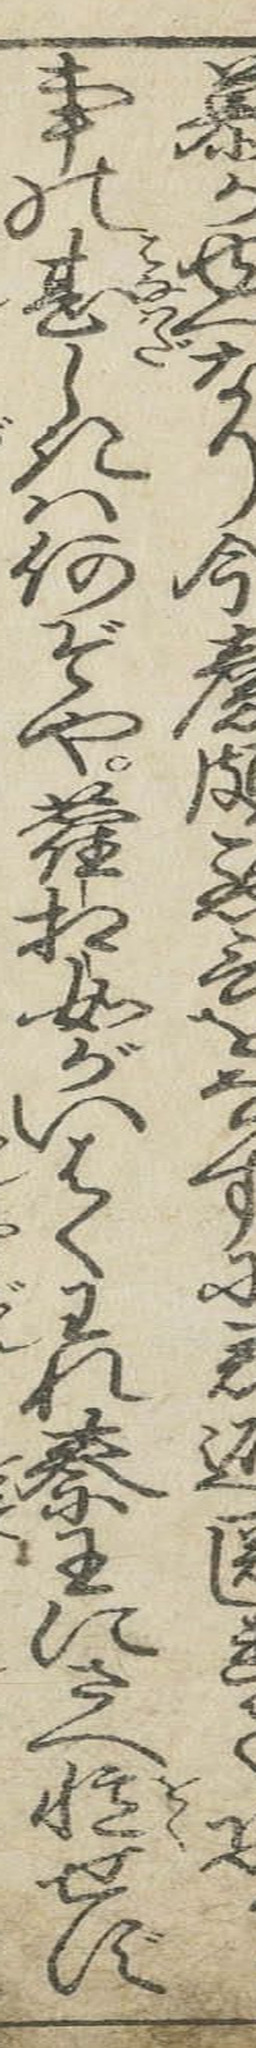事の甚しきは何ぞや。藺-相-如がいはくわれ秦王にさへ臆せず
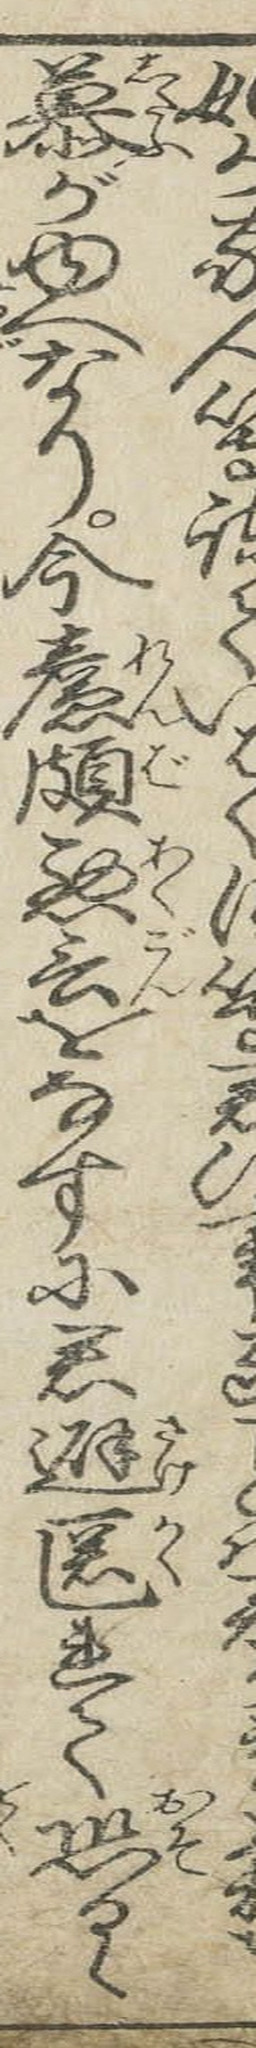慕がゆへなり。今廉頗悪言をなすに君避匿れて恐るゝ
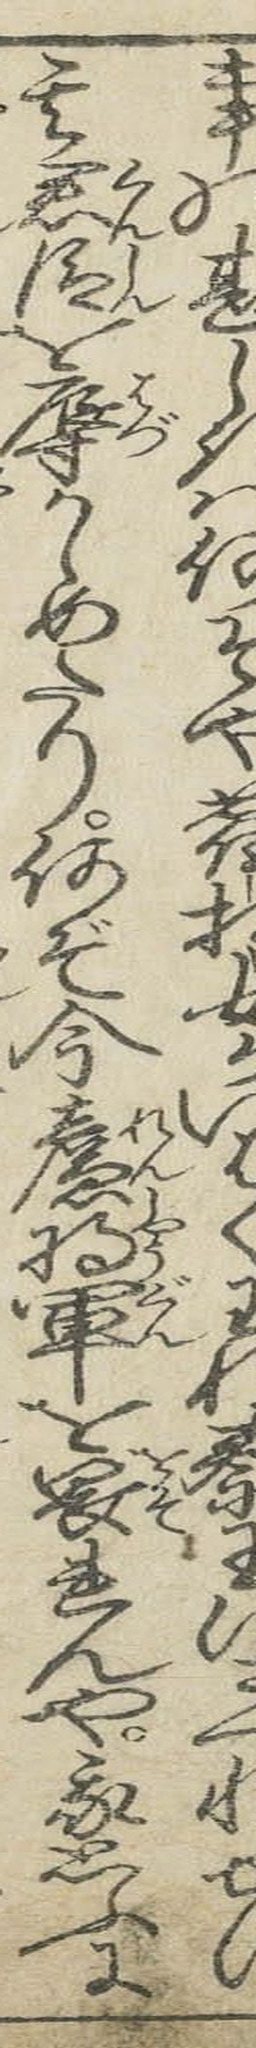其君臣を辱かしめたり。何ぞ今廉将軍を畏れんや。我思ふに
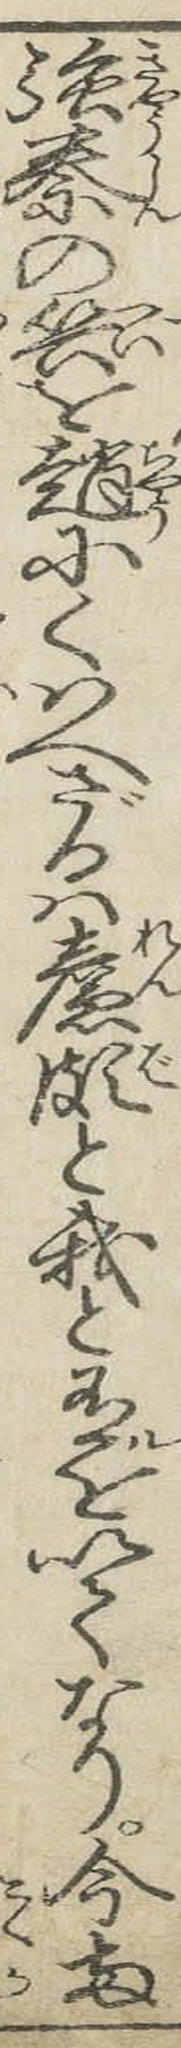強秦の兵を趙にくはへざるは廉頗と我と有を以てなり。今両
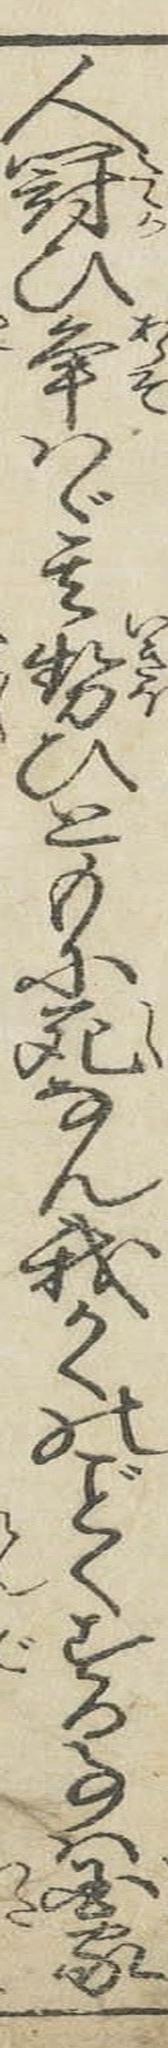人闘ひ争はゞ其勢ひともに死なん我かくのごとくする事は国家
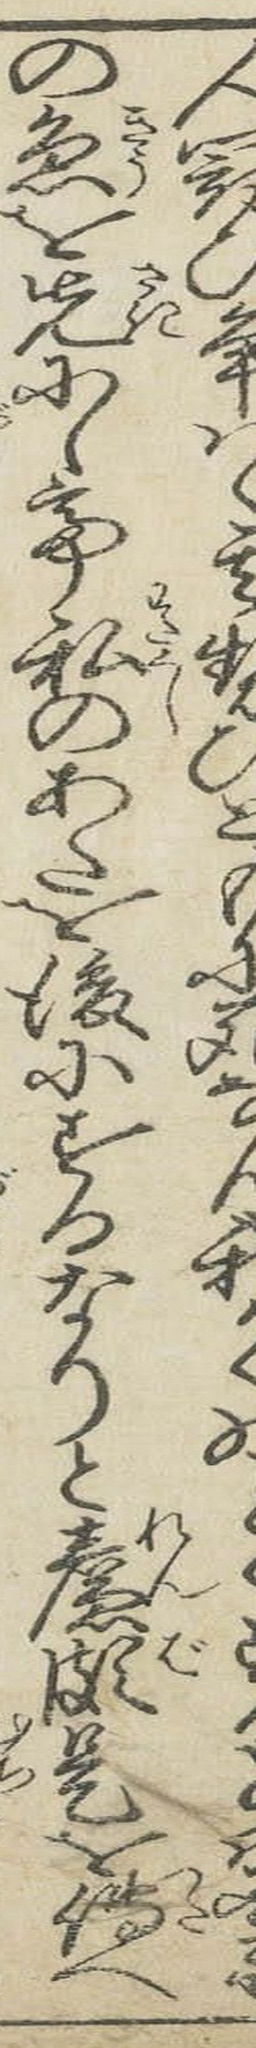の急を先にして私のあたを後にするなりと廉頗是を伝へ
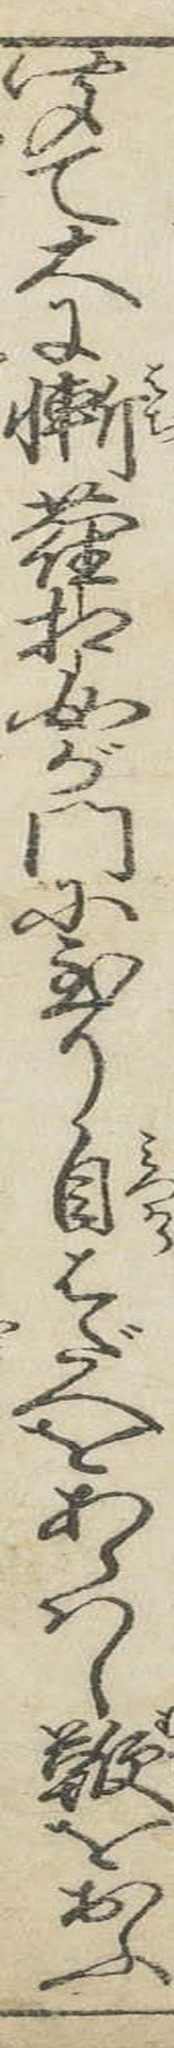聞て大に慚藺-相-如が門に至り自はだへをあらはし鞭をおふ
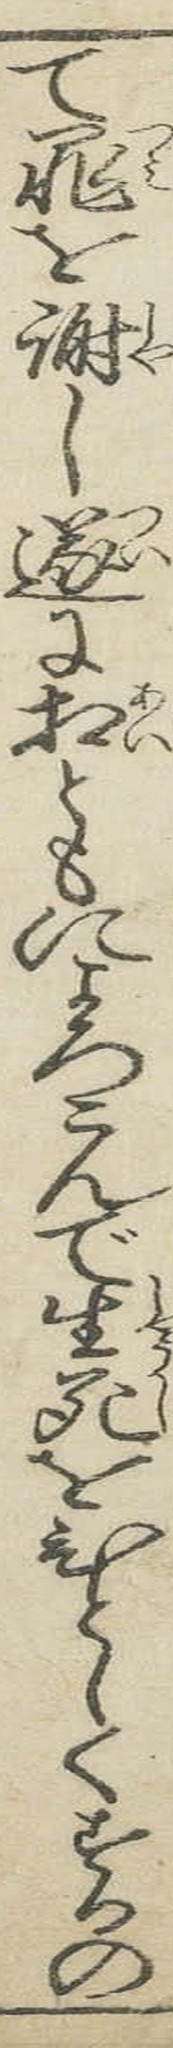て罪を謝し遂に相ともによろこんで生死をひとしくするの
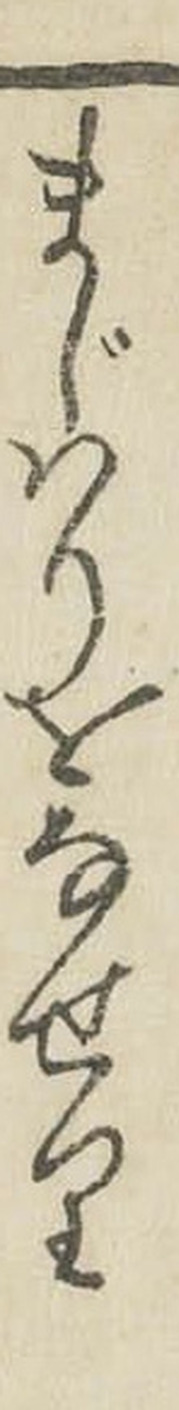まじはりをなせり
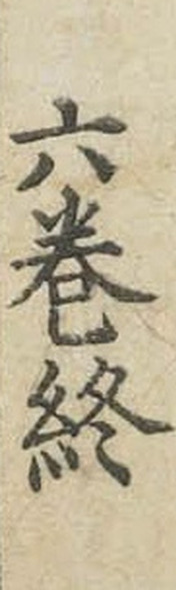六巻終
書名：絵本写宝袋 9巻 6之巻
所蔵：東京学芸大学教育コンテンツアーカイブ
